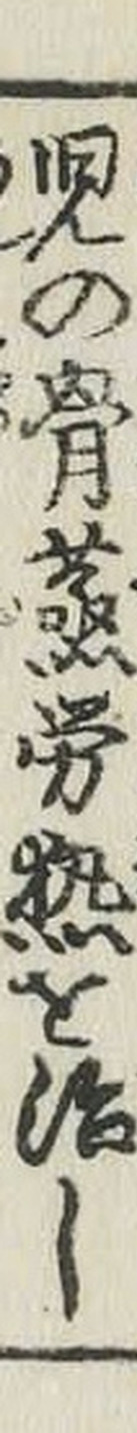児の骨蒸労熱を治し
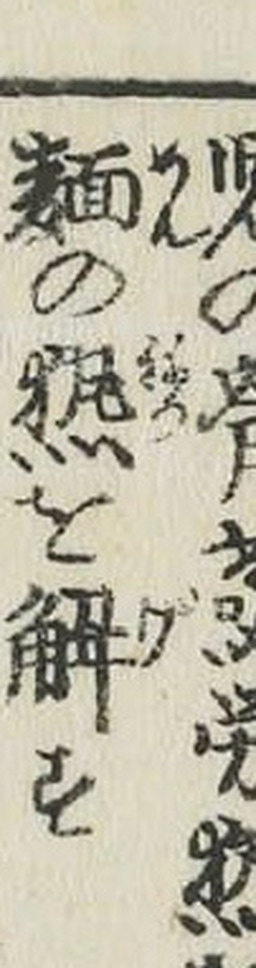麺の熱を解す
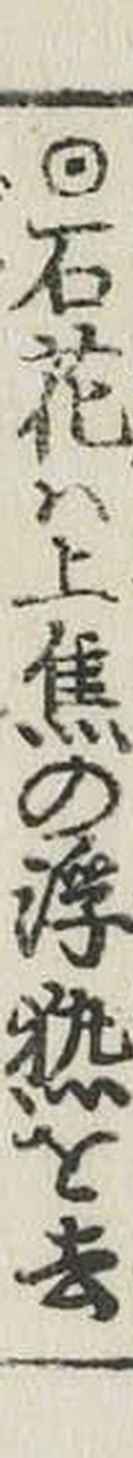○石花は上焦の浮熱を去
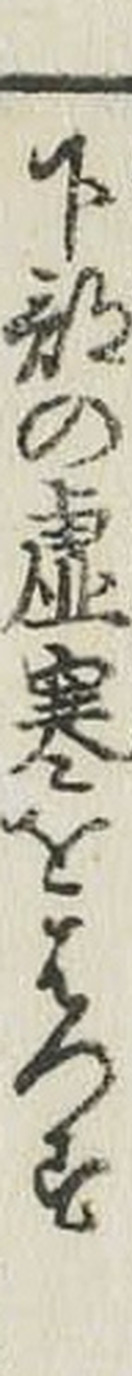下部の虚寒をはつす
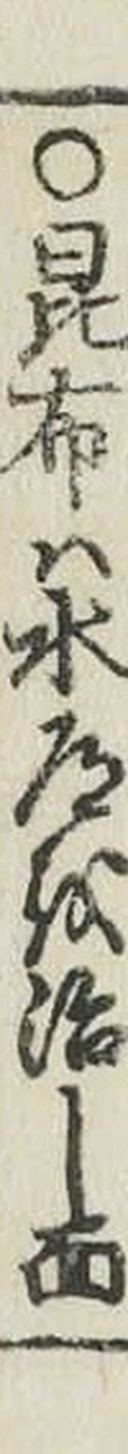○昆布は水道を治し面
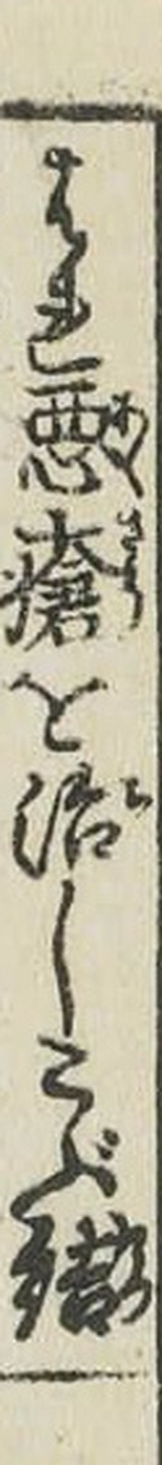はれ悪瘡を治しこぶ結
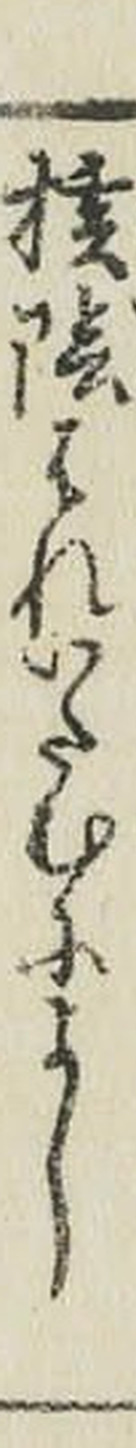核陰はれいたみによし
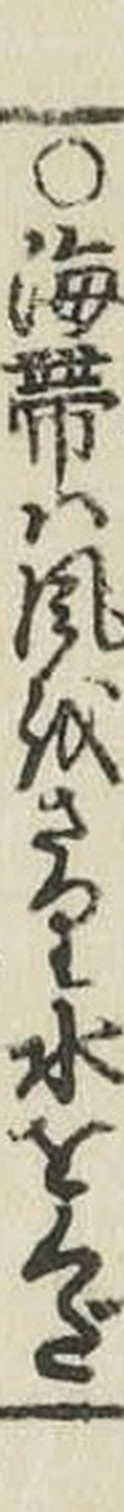○海帯は風をさり水をくだ
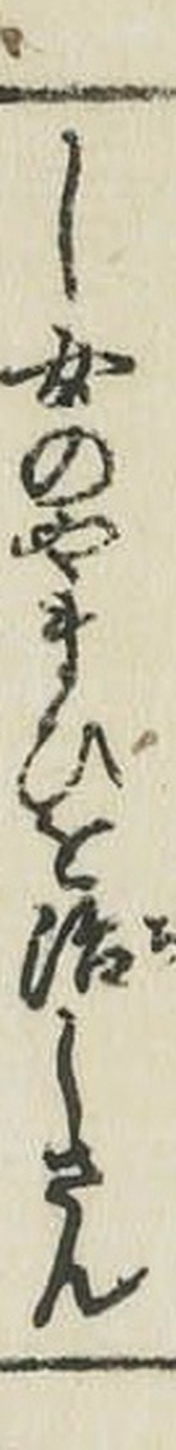し女のやまひを治しさん
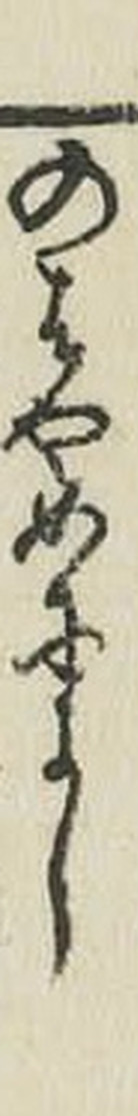のはやめによし
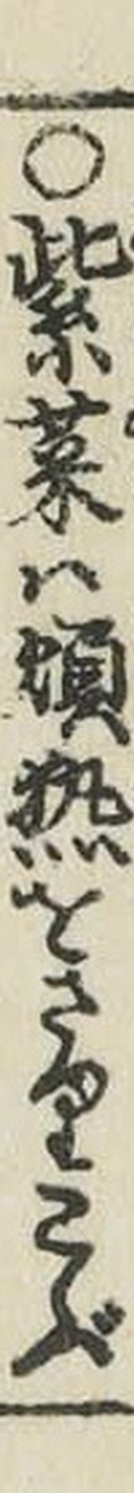○紫菜は煩熱をさりこぶ
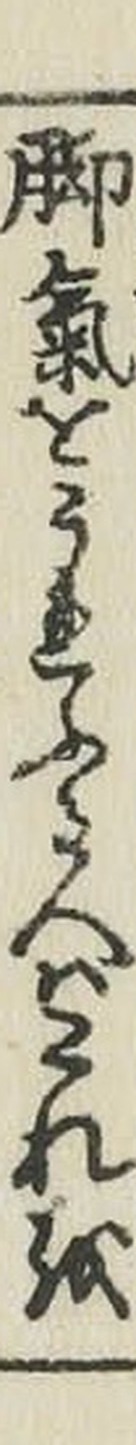脚気をうれふる人はこれを
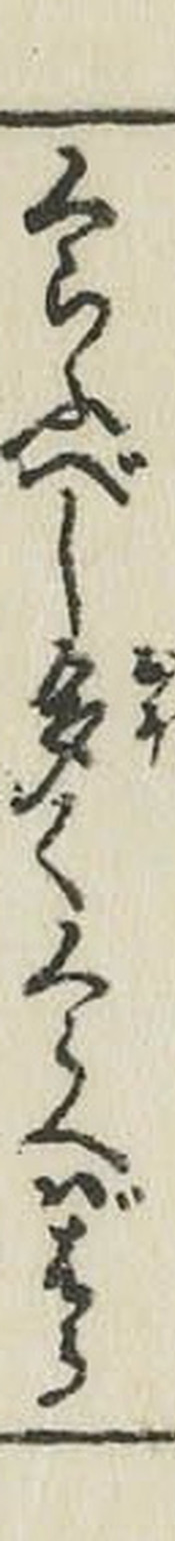くらふべし多くくらへばはら
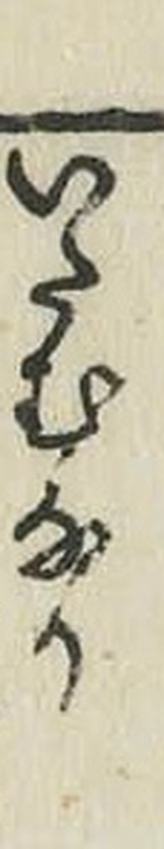いたむなり
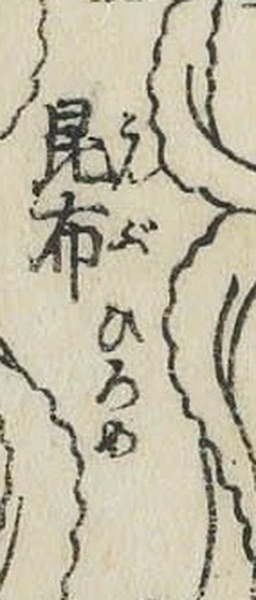昆布ひろめ
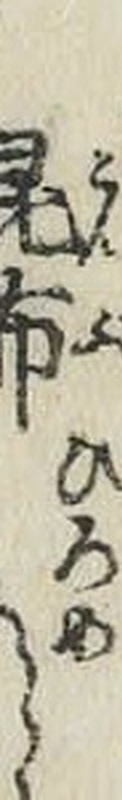昆布ひろめ
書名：増補頭書訓蒙図彙大成 10巻 8:巻之17-19
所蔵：東京学芸大学教育コンテンツアーカイブ
